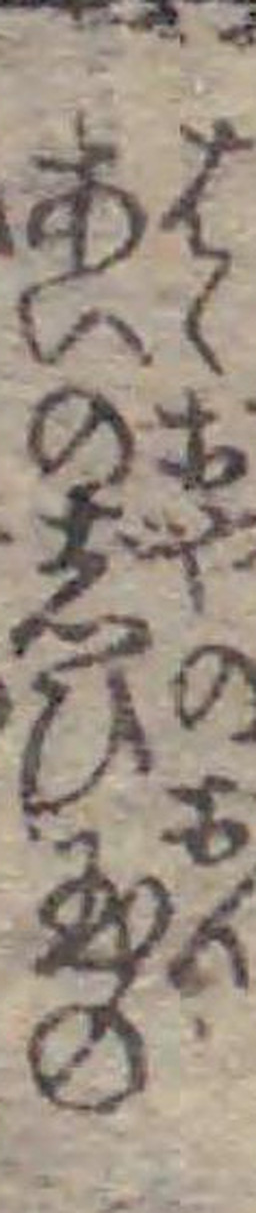あいのじひ玉の
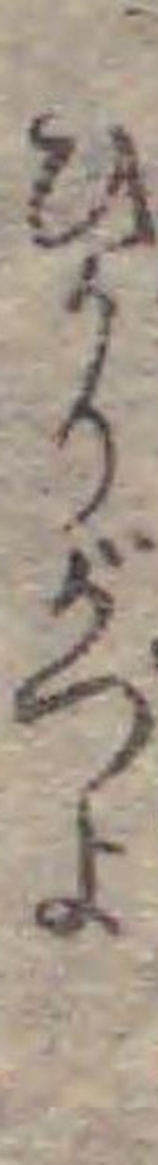ひかりがつよ
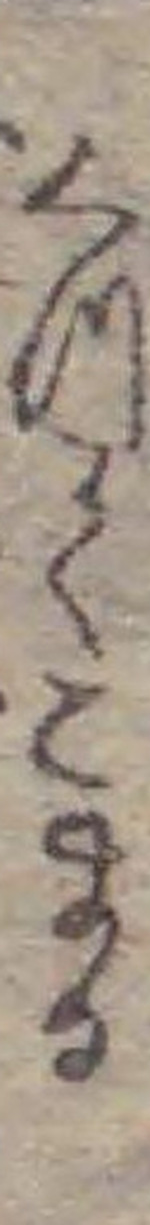くつてこまる
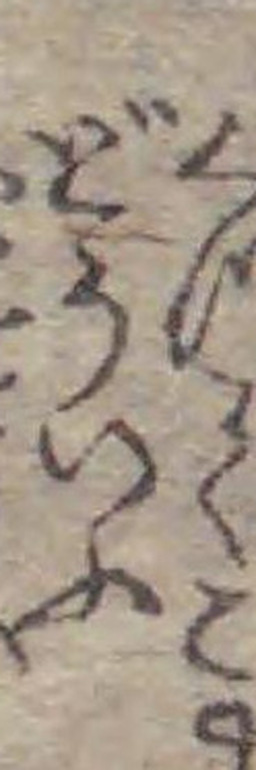どういふ
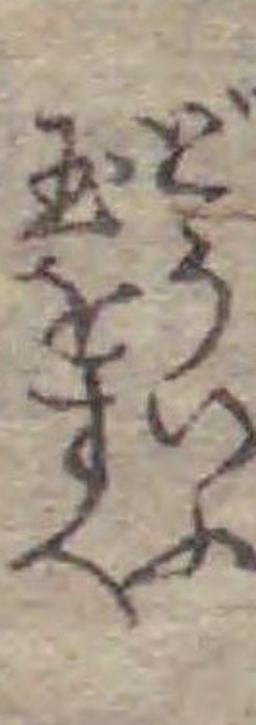玉をすへ
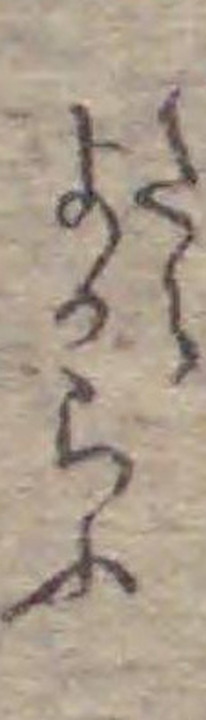よからふ
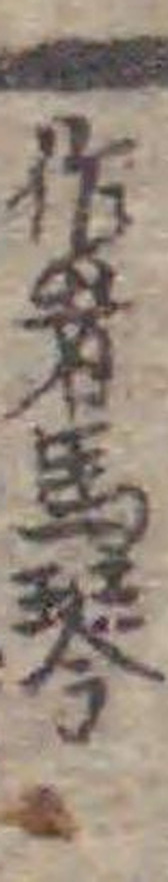作者馬琴
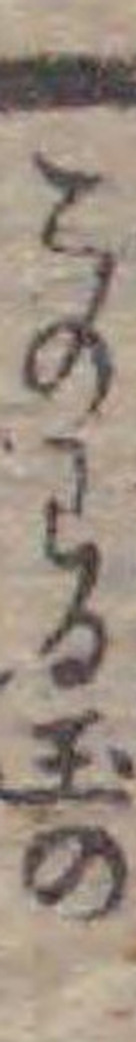このわる玉の
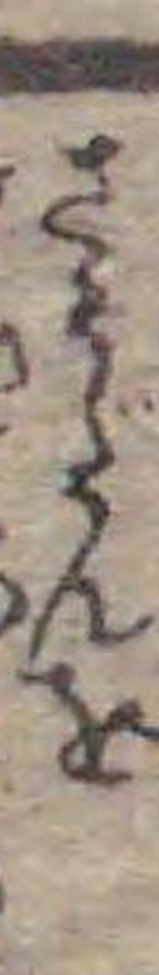さうだんを
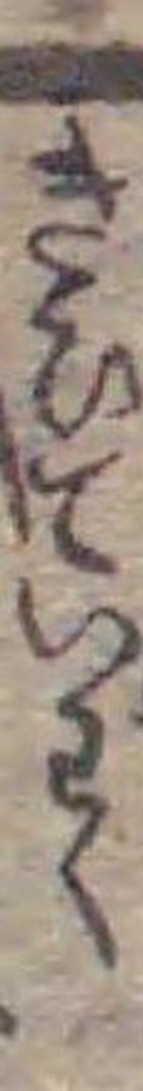きひていわく
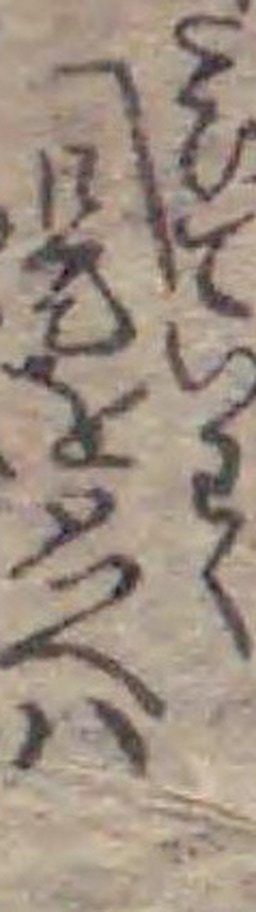〽是を思へは
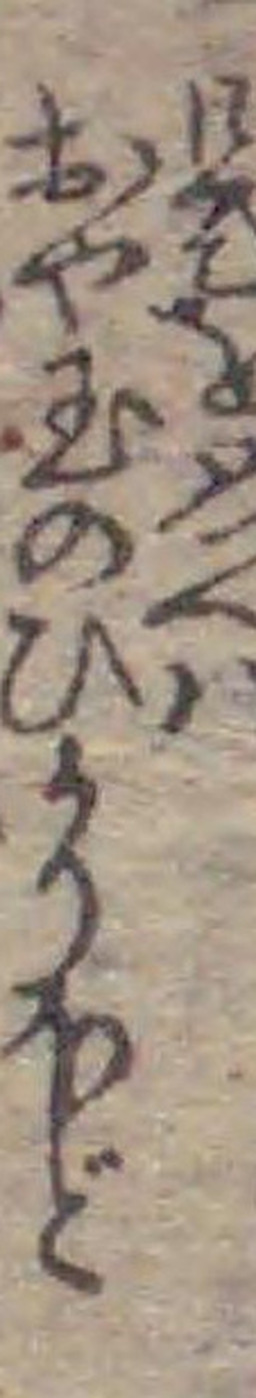おや玉のひかりほど
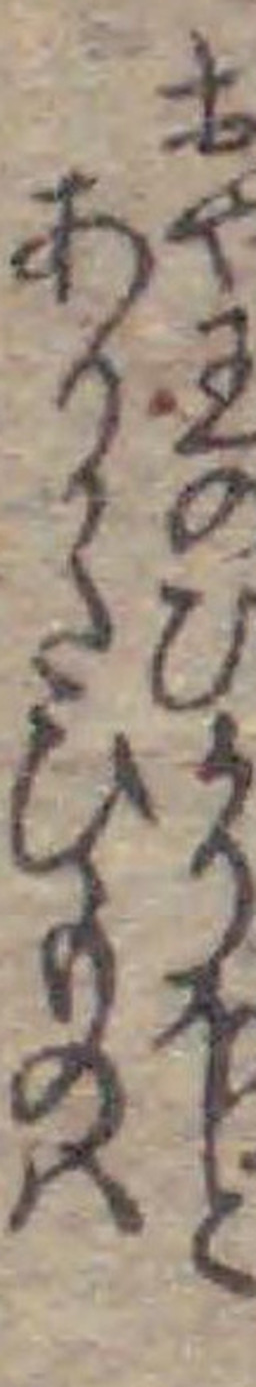ありかたひものは
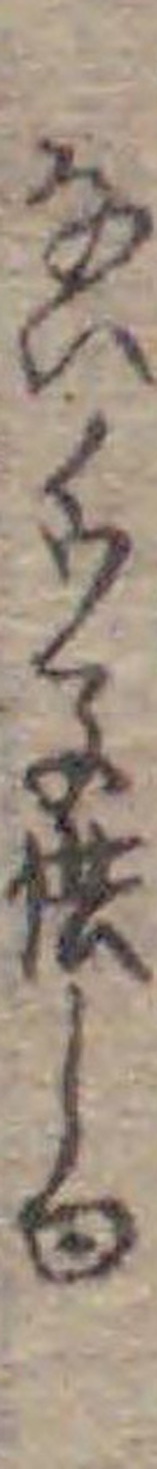ないノウ子供しゆ

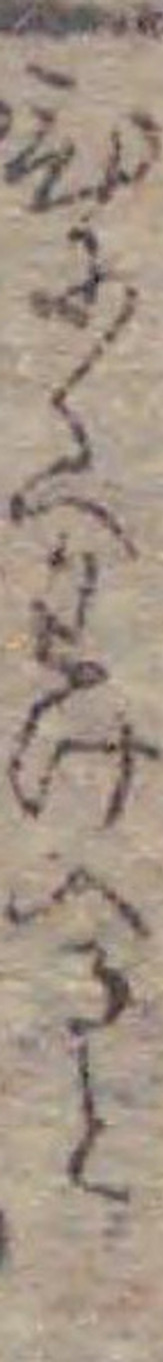ひにくへわけ入ると
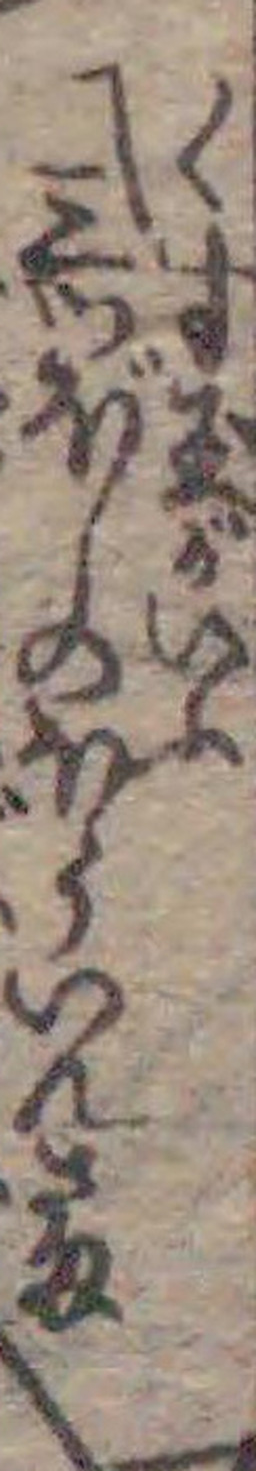〽三つぼしのほういんさま
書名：四遍搨心学草帋 : 3巻
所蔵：国立国会図書館 National Diet Library, JAPAN
